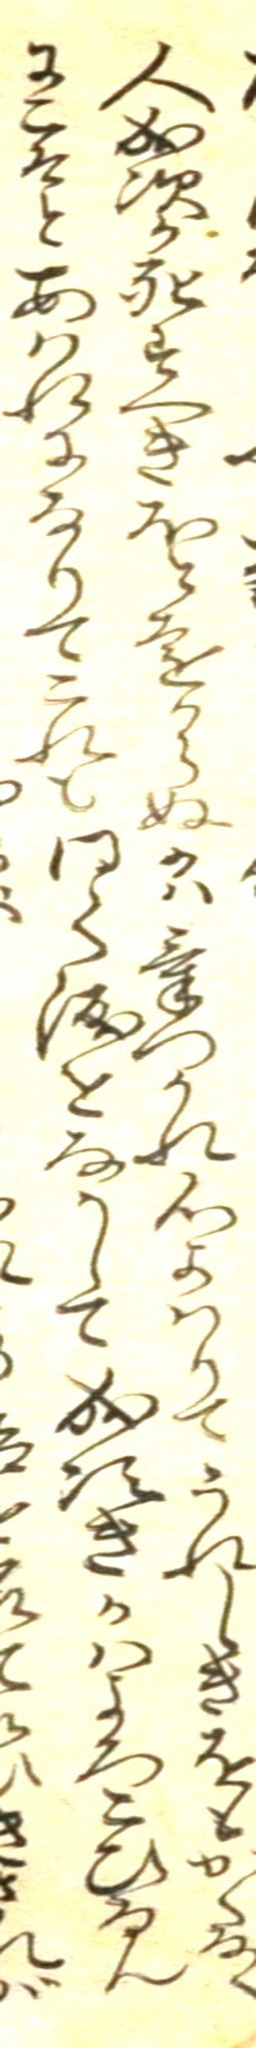にこそとあはれになりてこれも同く涙をなかして成次きかはよろこひなん
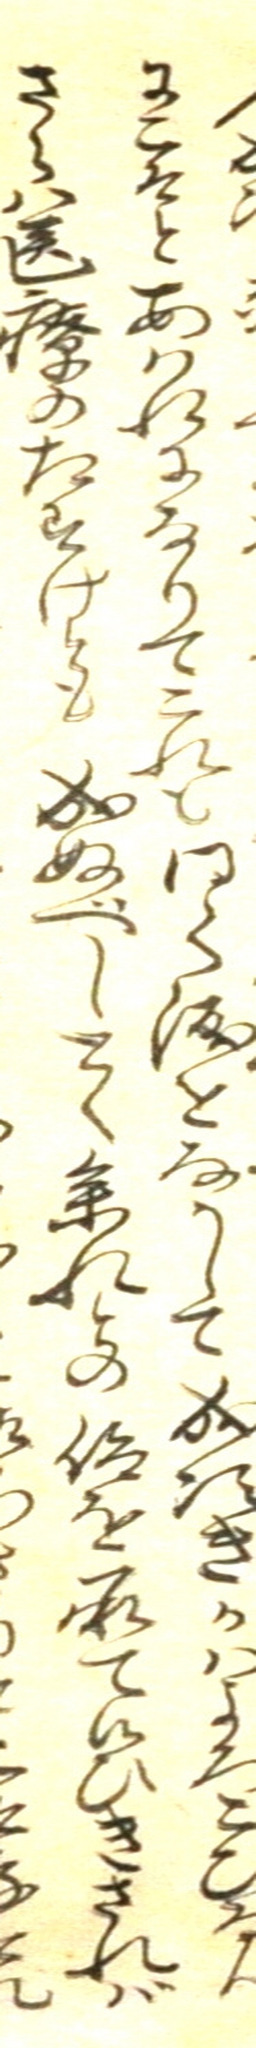さらは医療のたすけとも成ぬべしとく参れとの仰を承て候ひきされば
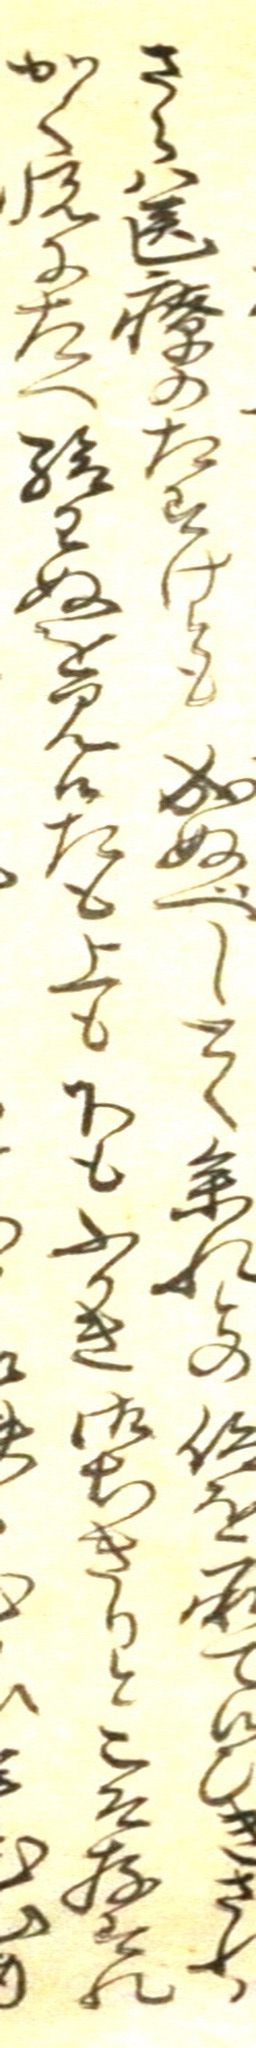かく悦にたへ給わぬを見候たも上も下もふかき御ちきりとこそ存すれ
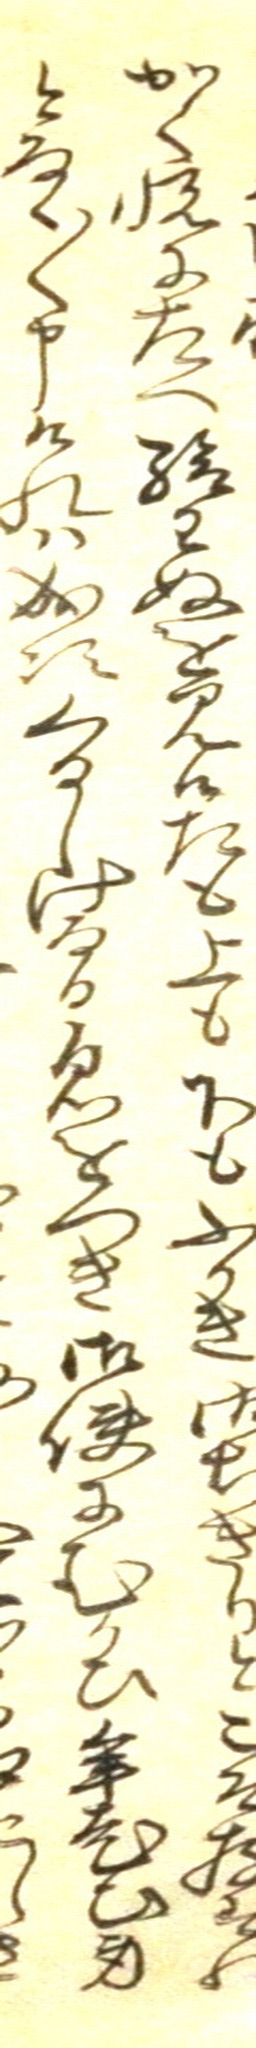となく〳〵申けれは成次くるしけなる息をつき御使にむかひ年老ひ身
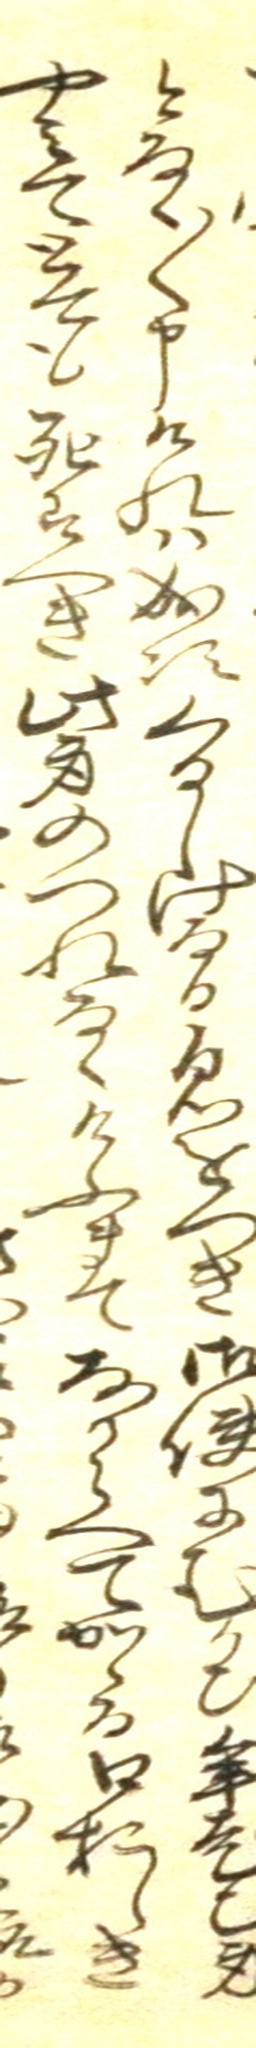やみてとても死すへき此身のつれなくけふまてなからへてかゝる口おしき
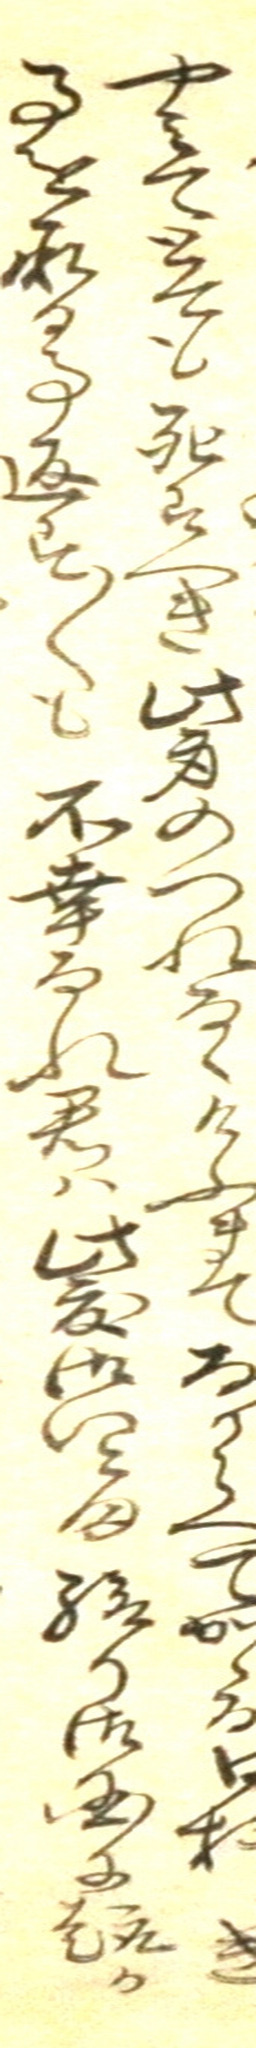事を承る事返す〳〵も不幸なれ君は此度御いとま給り御国に趣か
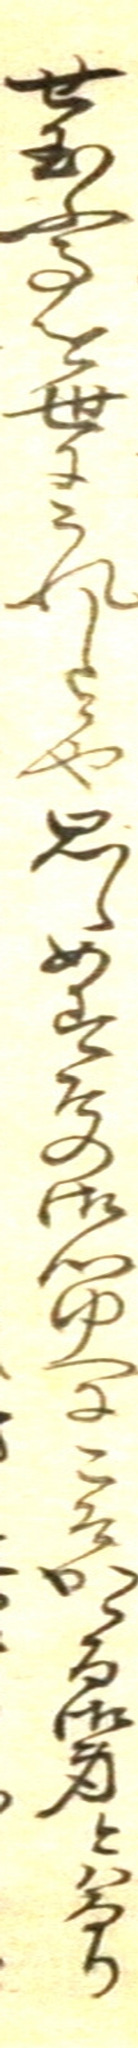せ玉ふ事を世にうれしとや思しめすその御心ゆへにこそかゝる御身とはなり
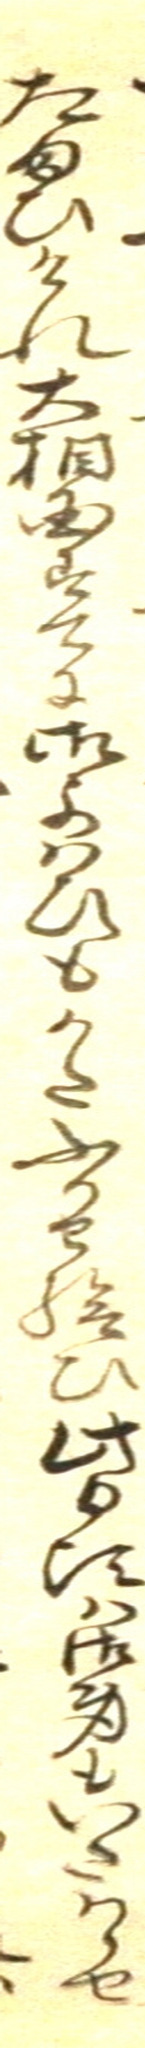たまひけれ大相国すてに御よはひもかたふりせ給ひ此日頃は御身もいたはらせ
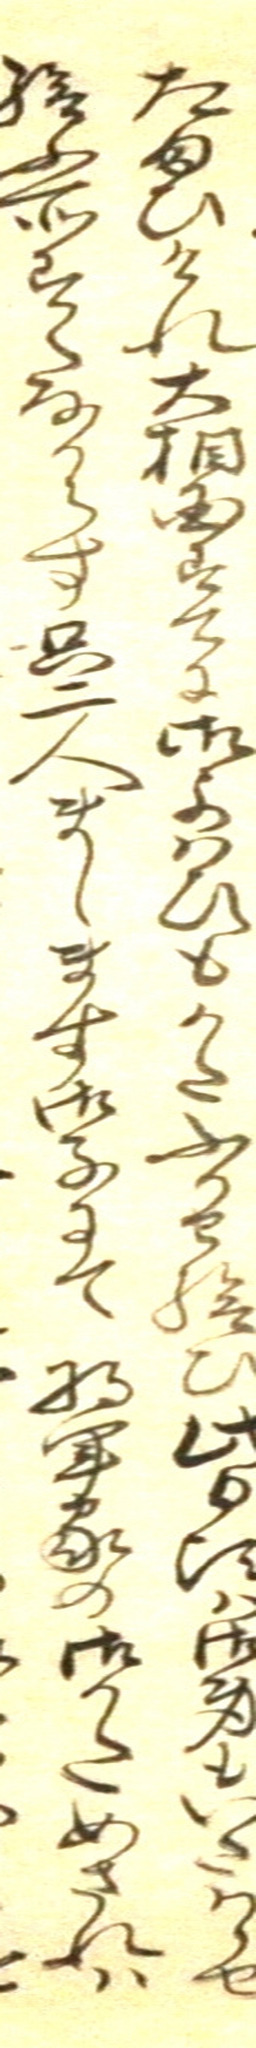給ふ所すくなからす只二人まします御子にて将軍家の御かためされは
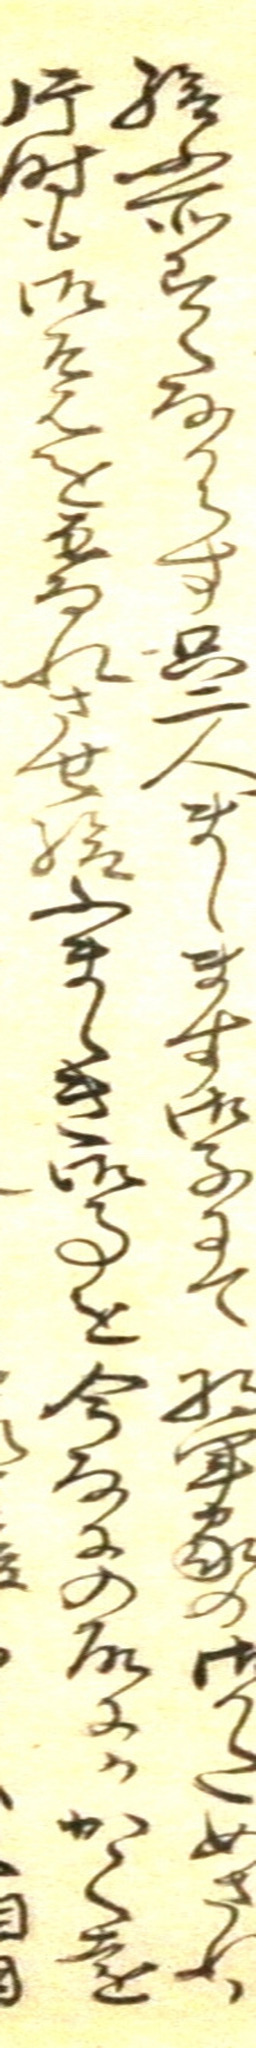片時も御そはをはなれさせ給ふましき御事を今なにの故にかかく遠
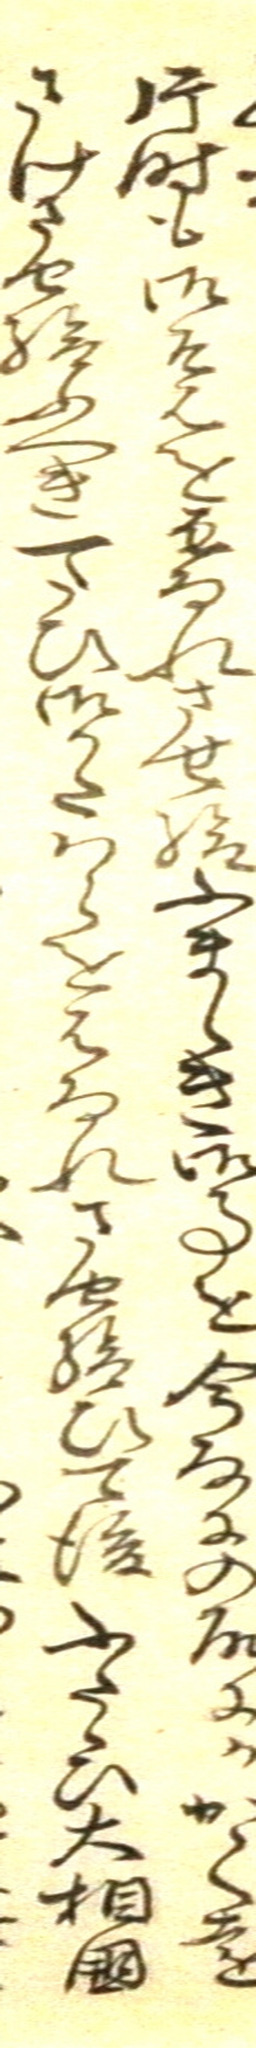さけさせ給ふへき一たひ御かたはらをはなれさせ給ひて後ふたゝひ大相国
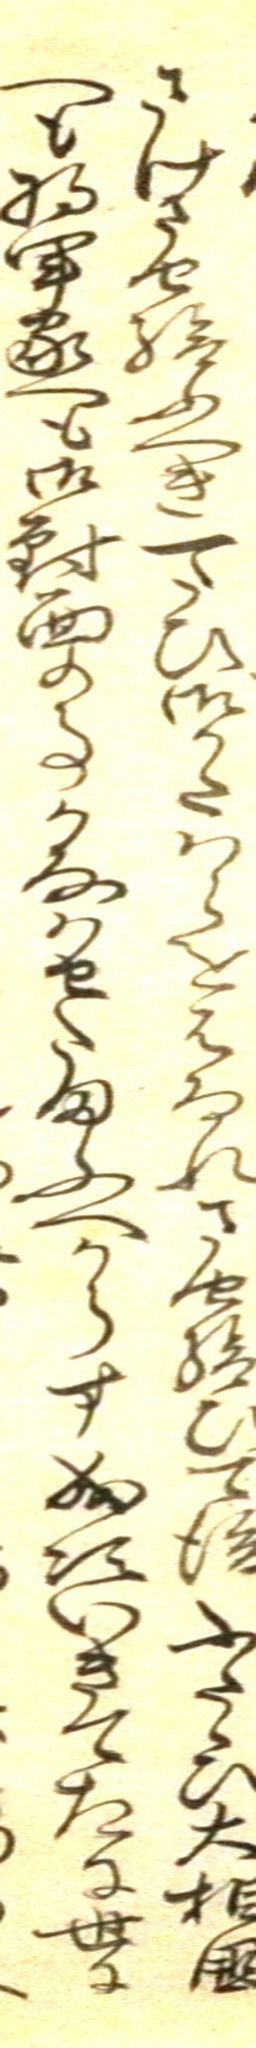へも将軍家へも御対面の事かなはせたまふへからす成次いきてたに世に
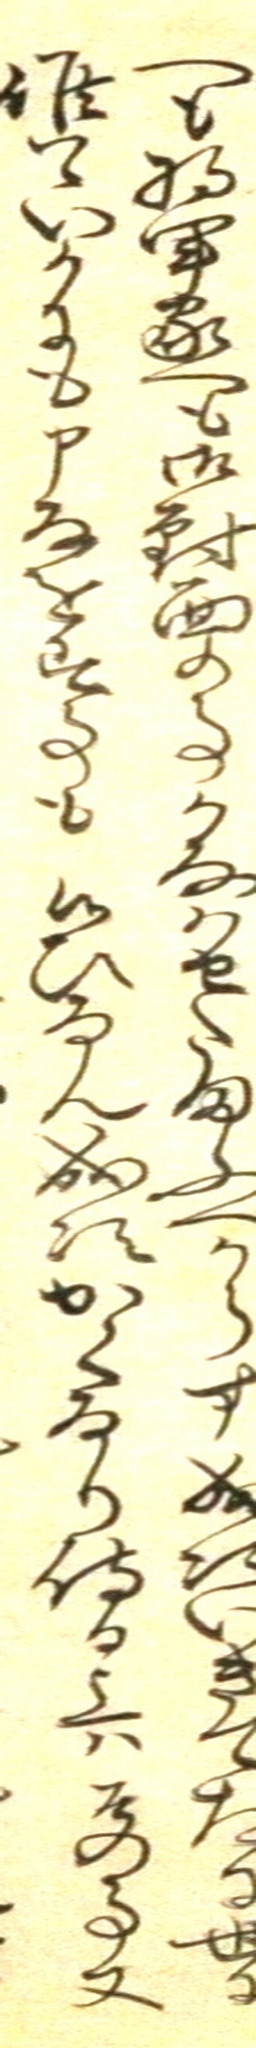候はゝいかにも申なをす事候ひなん成次かくなり侍る上はその事又
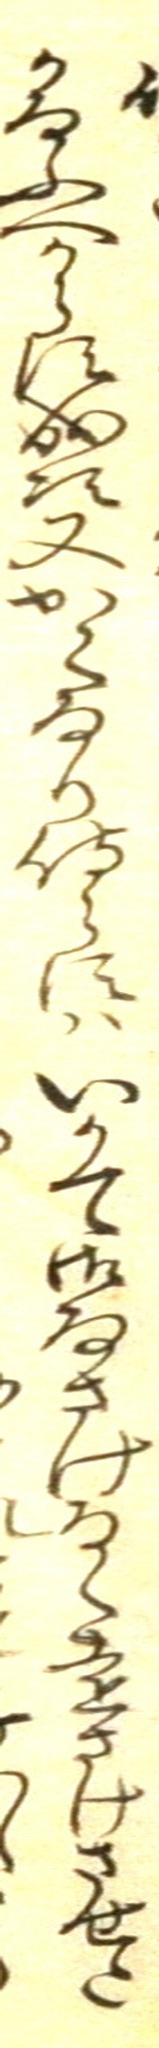かなふへからす成次又かくなり侍らすはいかて御なさけなく遠さけさせた
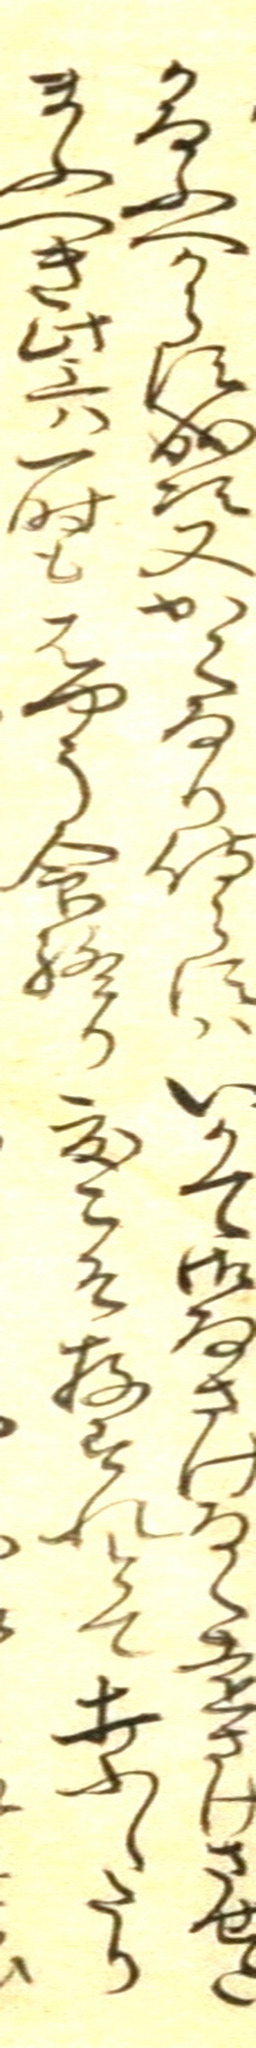まふへき此上は一時もはやう命終り度こそ存すれとて打ふしたり
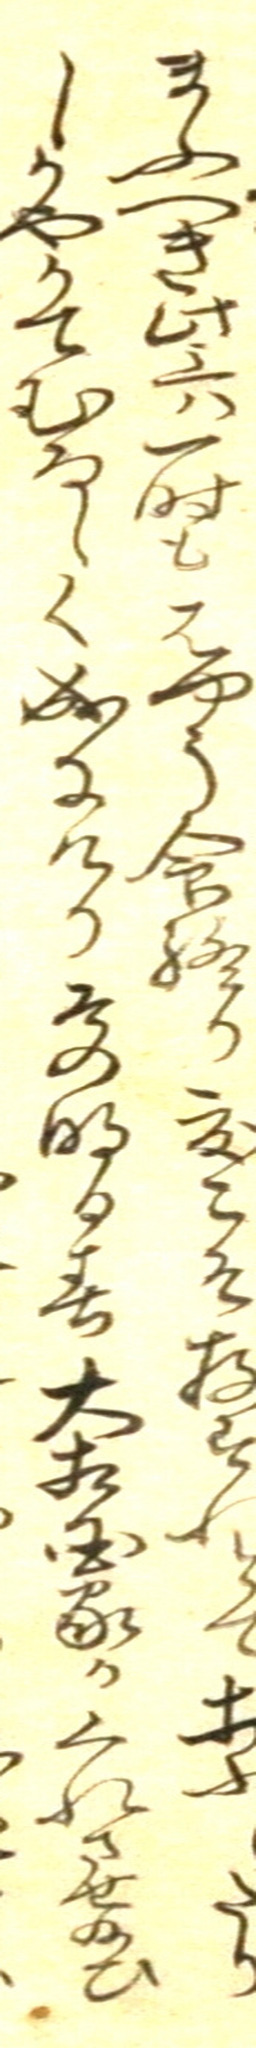しかやかてむなしく成にけりその明る春大相国家かくれさせ給ひ
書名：藩翰譜（四・中）
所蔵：伊那市立高遠町図書館・合同会社AMANE
